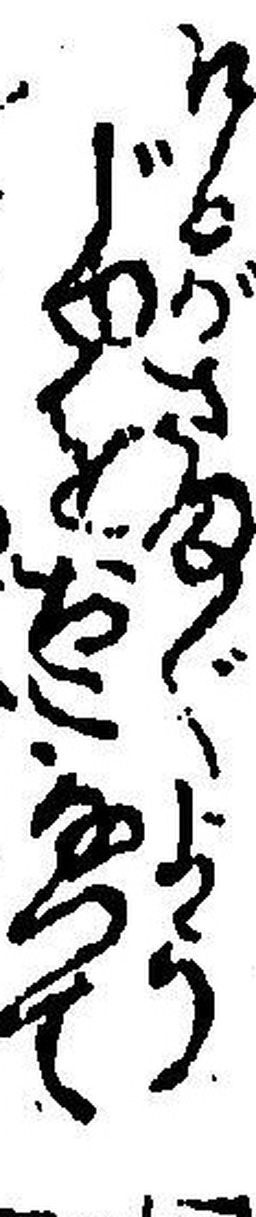じゆをおこなつて
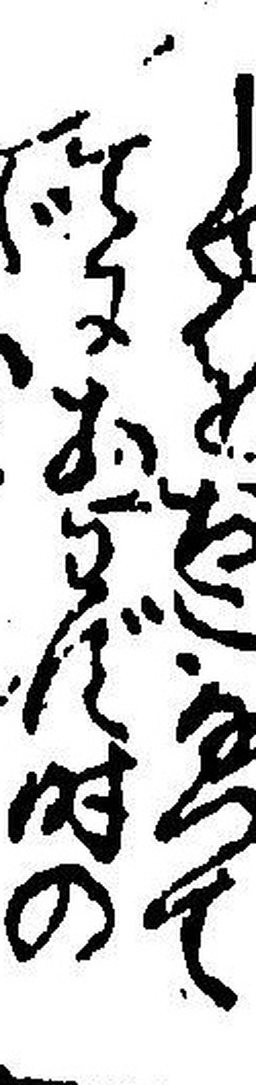てにおわ？ず時の
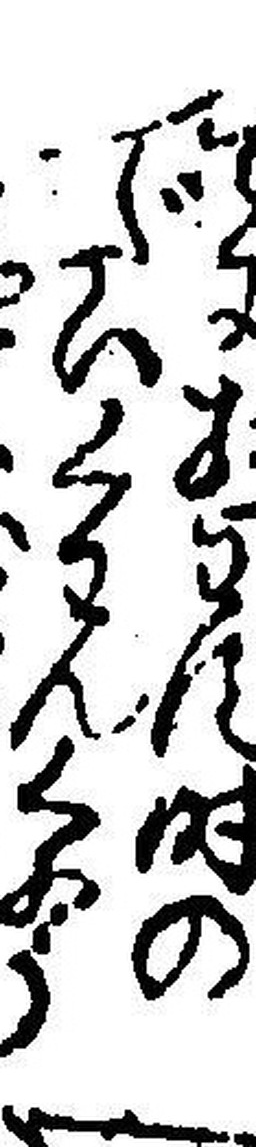だいくわんくふう
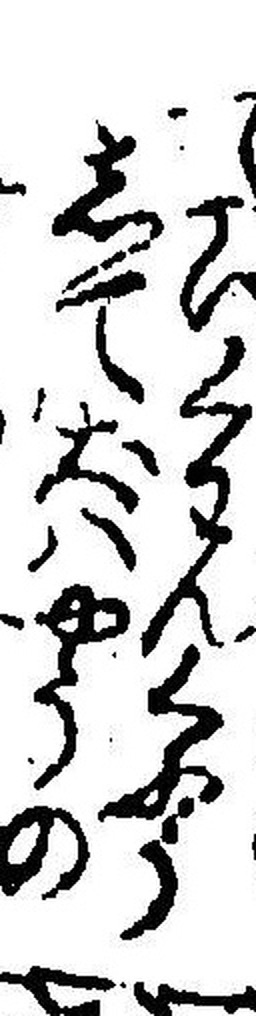して犬はやうの
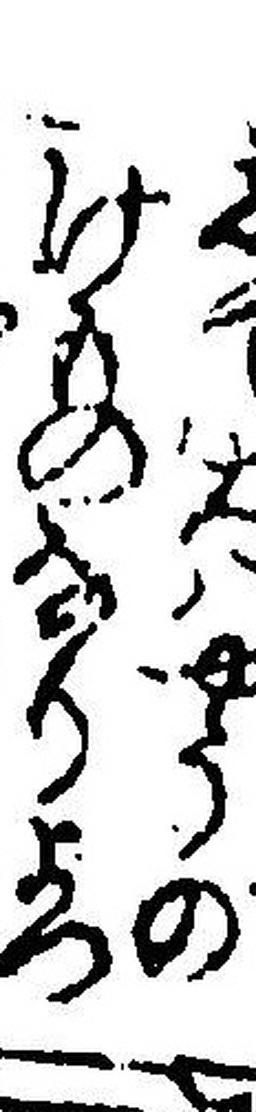けものなりよつ
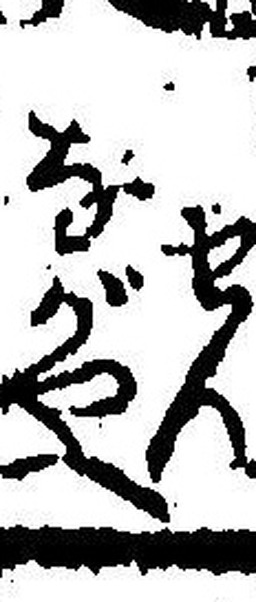ながやへ
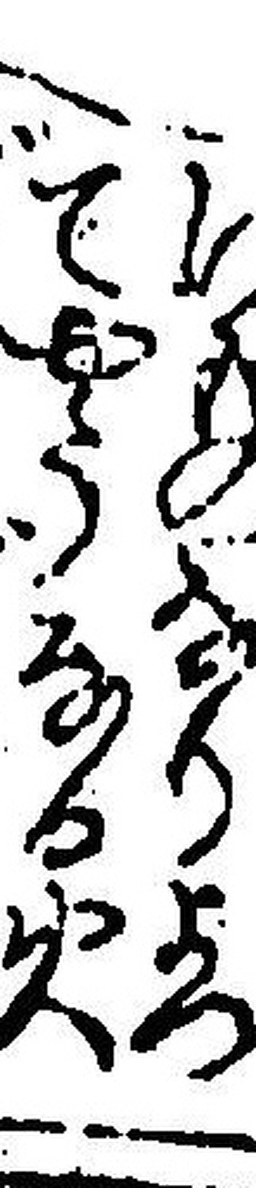てやうなる火
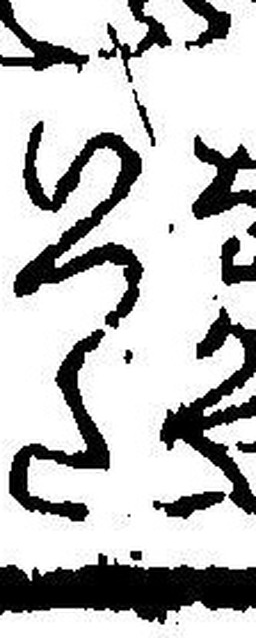いつた
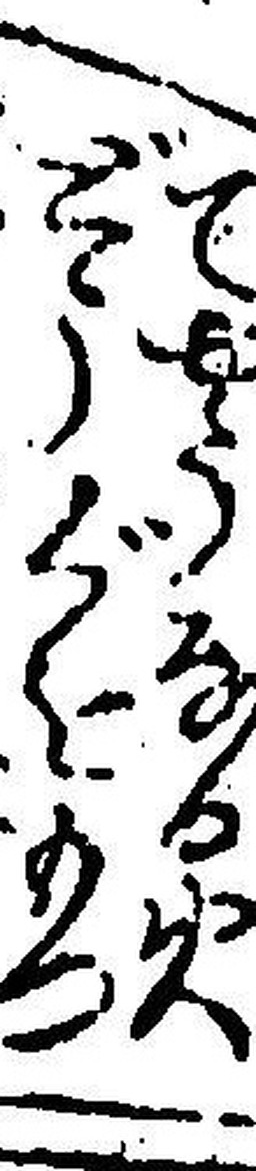どうぐをもつ
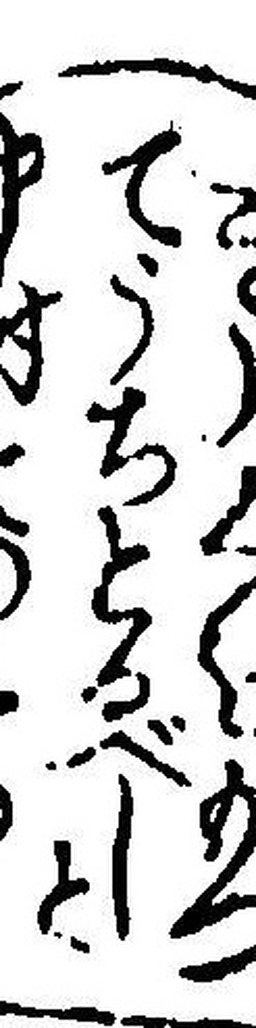てうちとるべし
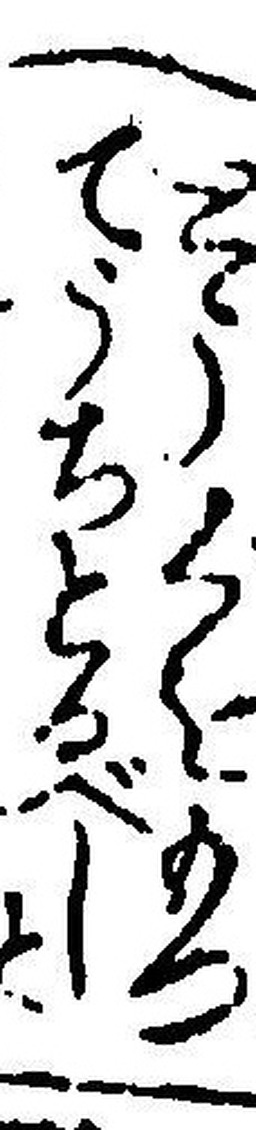てうちとるべし
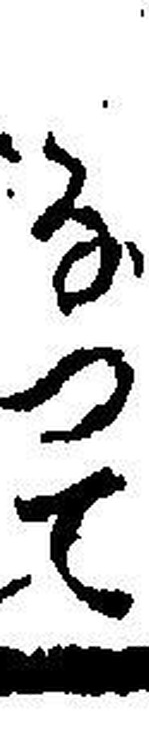なつて
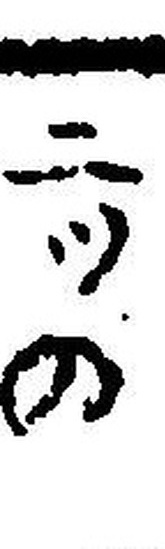二つの
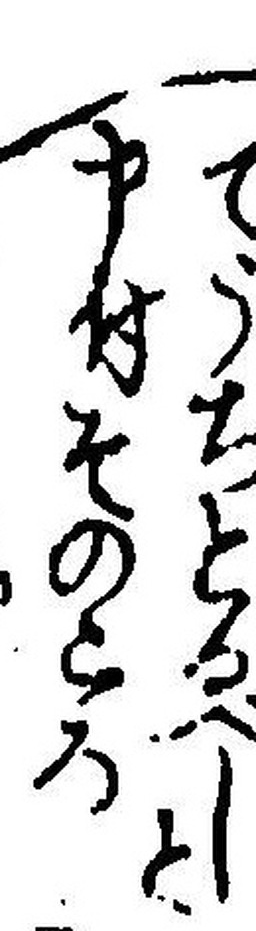申付そのころ
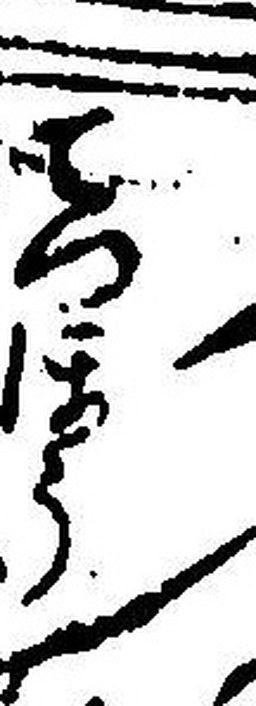てつほう
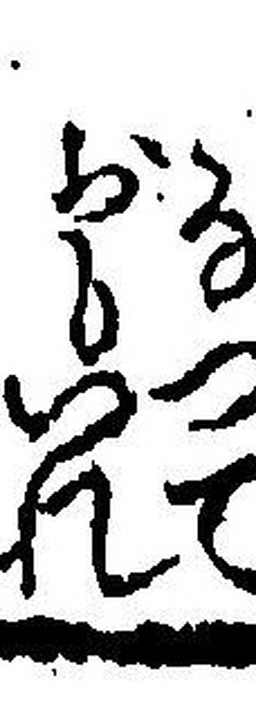おもいれ
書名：花芳野犬斑 / 山東京伝作
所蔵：東京大学総合図書館 General Library in the University of Tokyo, JAPAN
